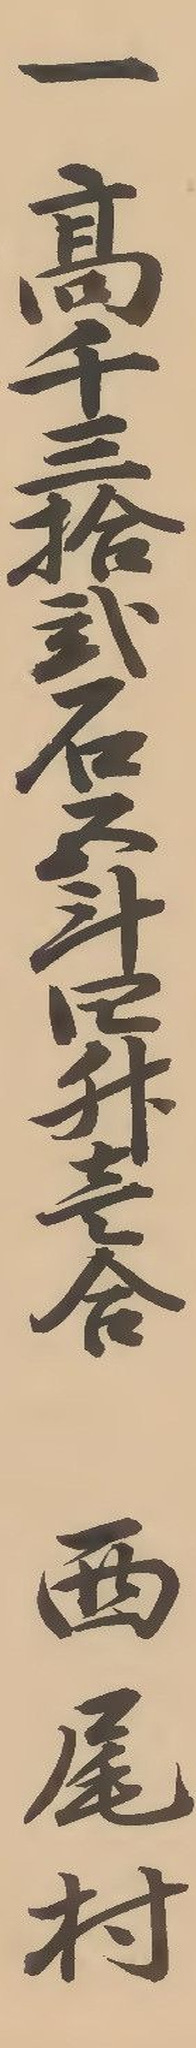一高千三拾弐石五斗四升壱合西尾村
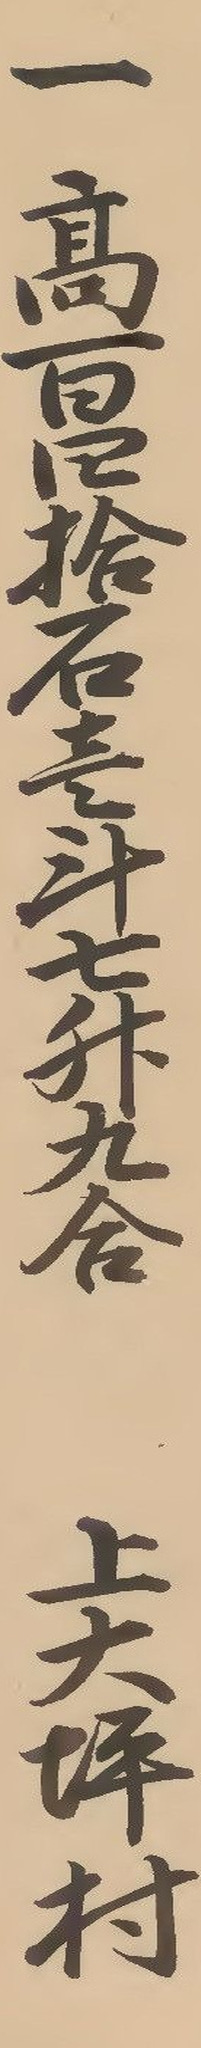一高百四拾石壱斗七升九合上大坪村
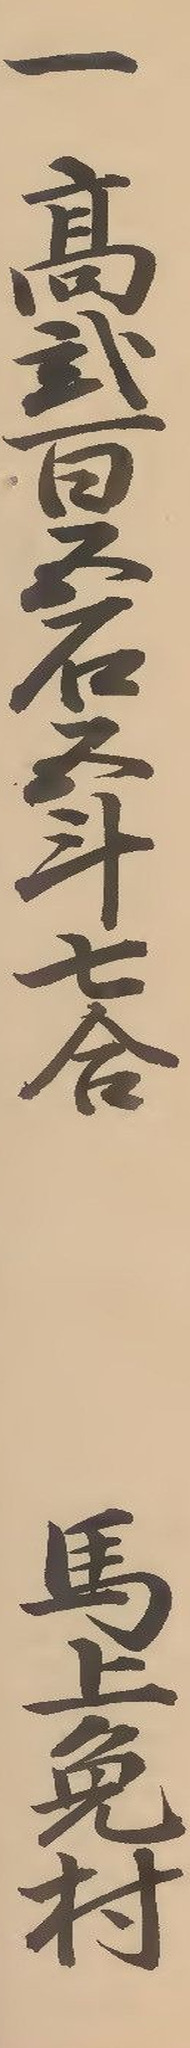一高弐百五石五斗七合馬上免村
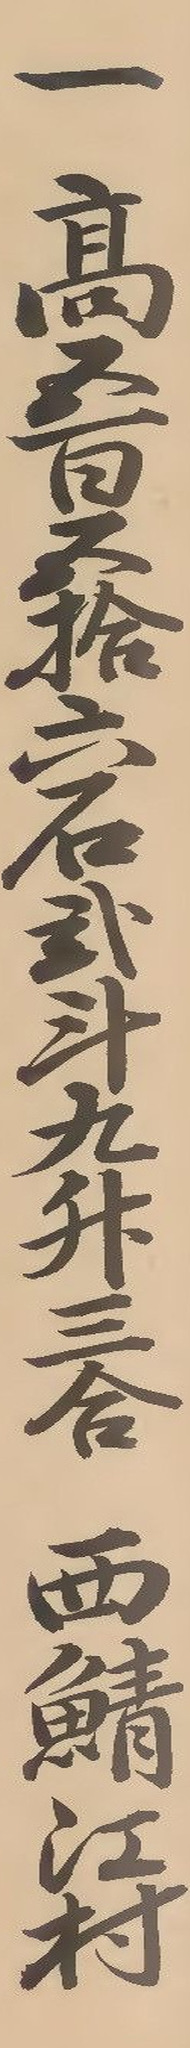一高五百五拾六石弐斗九升三合西鯖江村
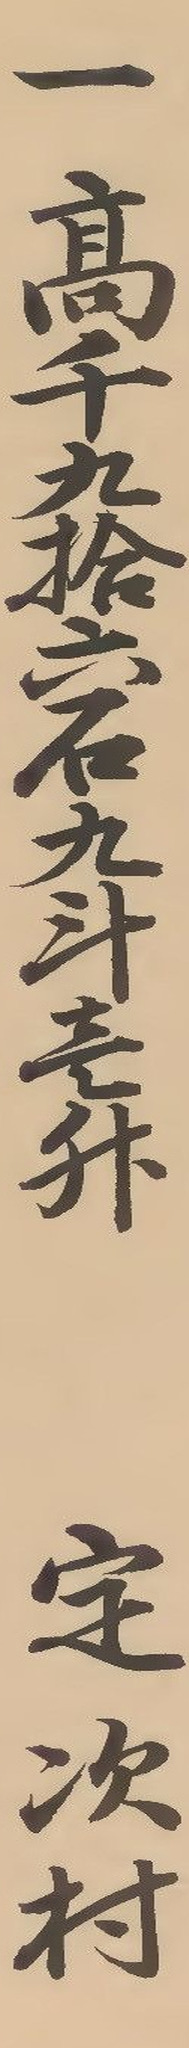一高千九拾六石九斗壱升定次村
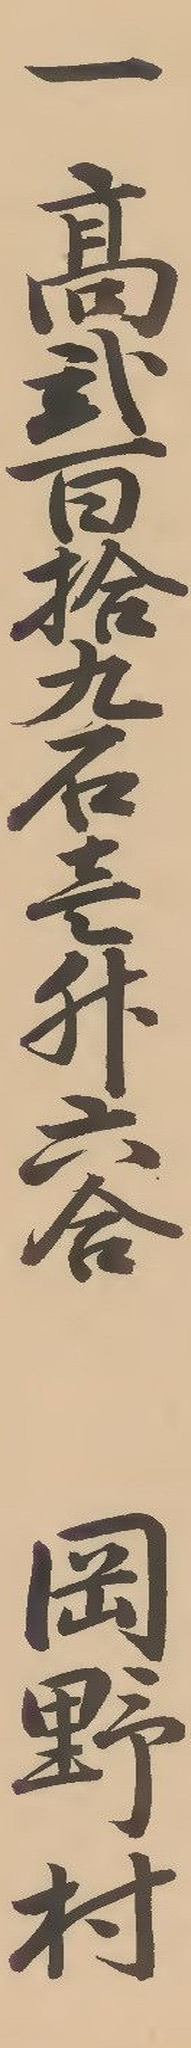一高弐百拾九石壱升六合岡野村

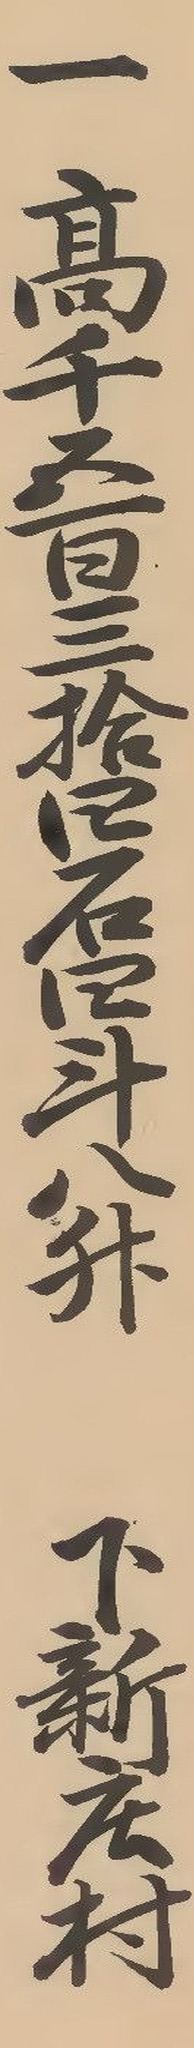一高千五百三拾四石四斗八升下新庄村
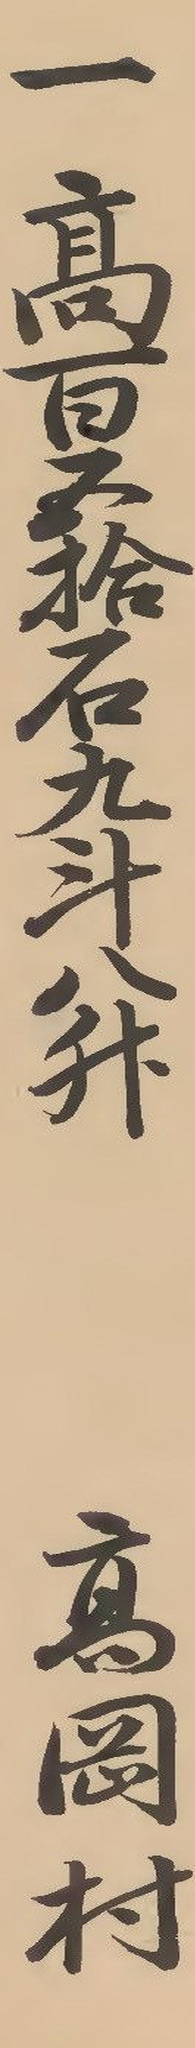一高百五拾石九斗八升高岡村
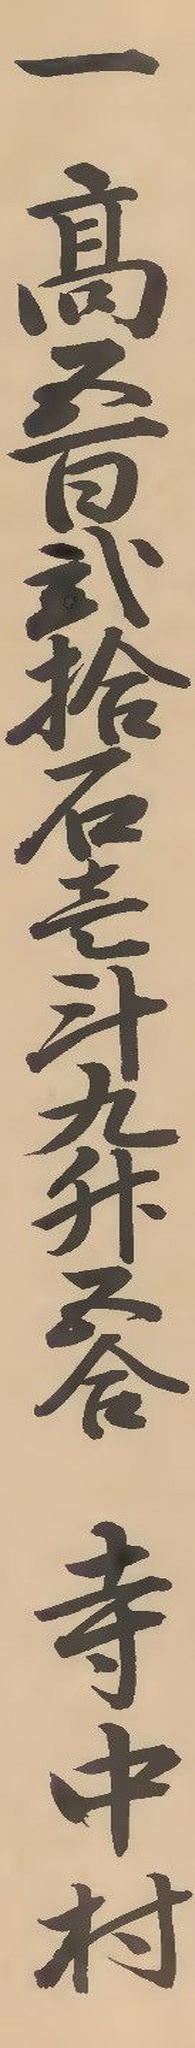一高五百弐拾石壱斗九升五合寺中村
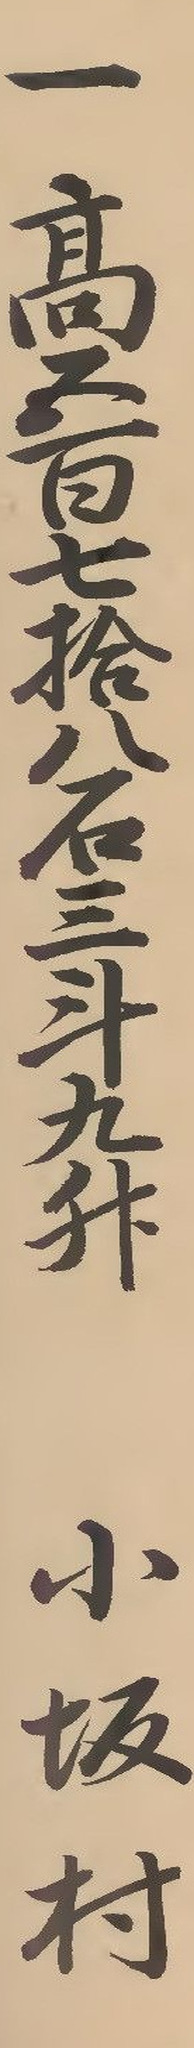一高五百七拾八石三斗九升小坂村
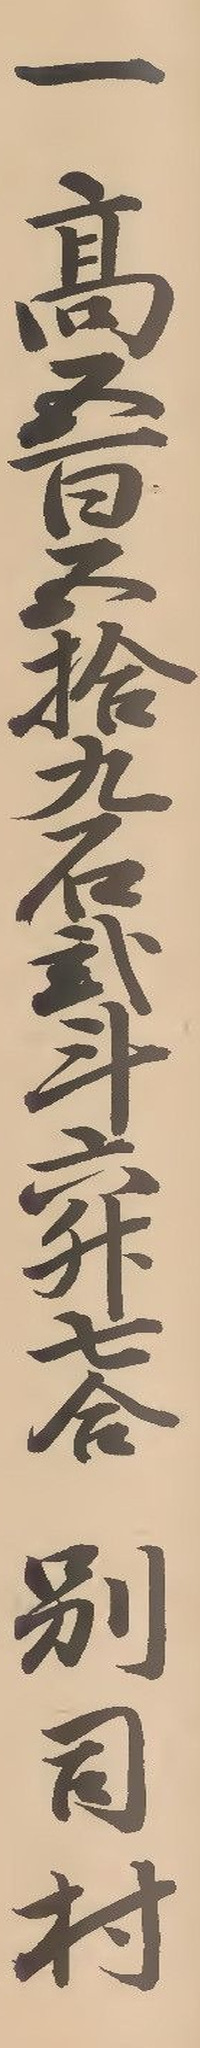一高五百五拾九石弐斗六升七合別司村
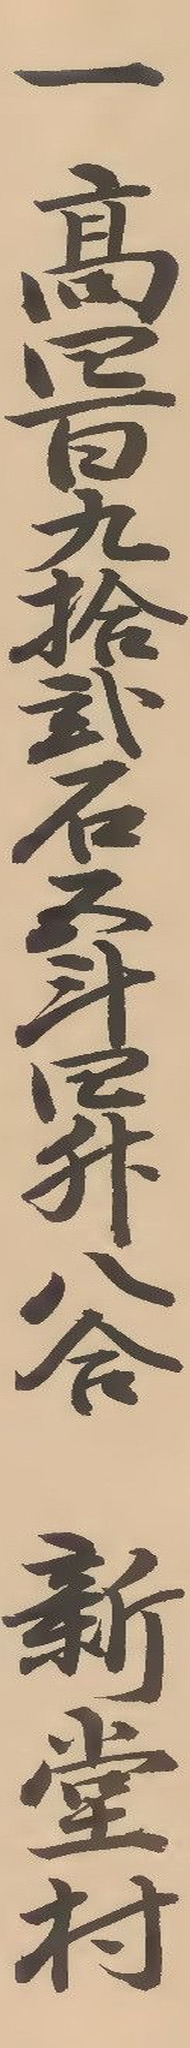一高四百九拾弐石五斗四升八合新堂村
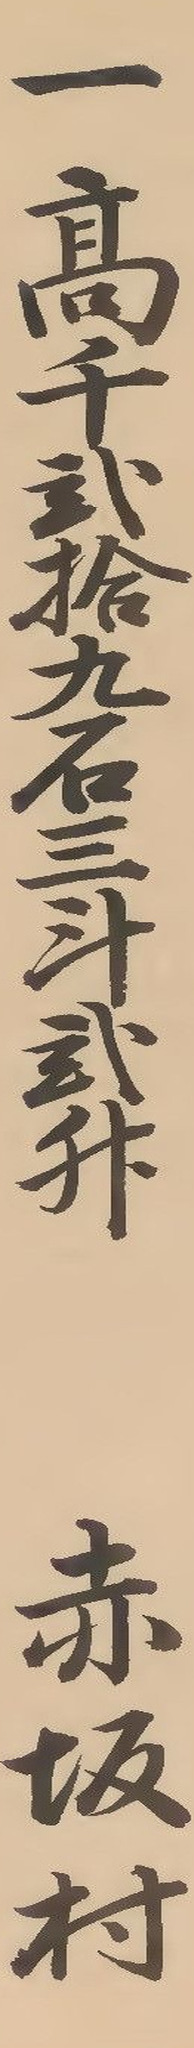一高千弐拾九石三斗弐升赤坂村
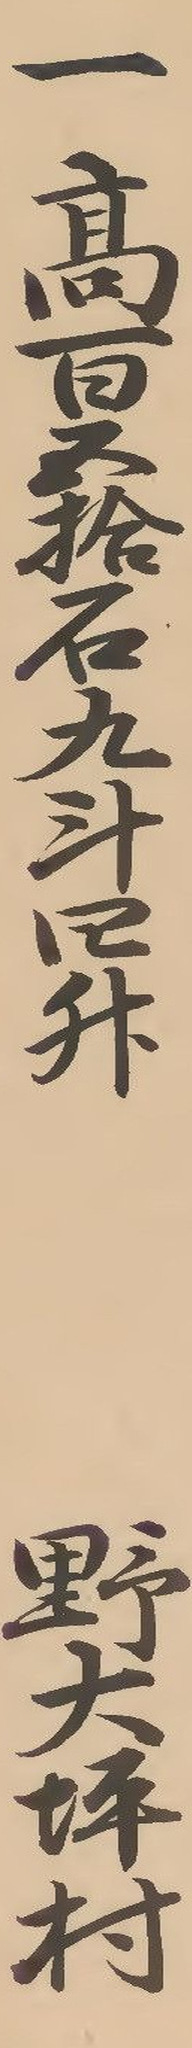一高百五拾石九斗四升野大坪村

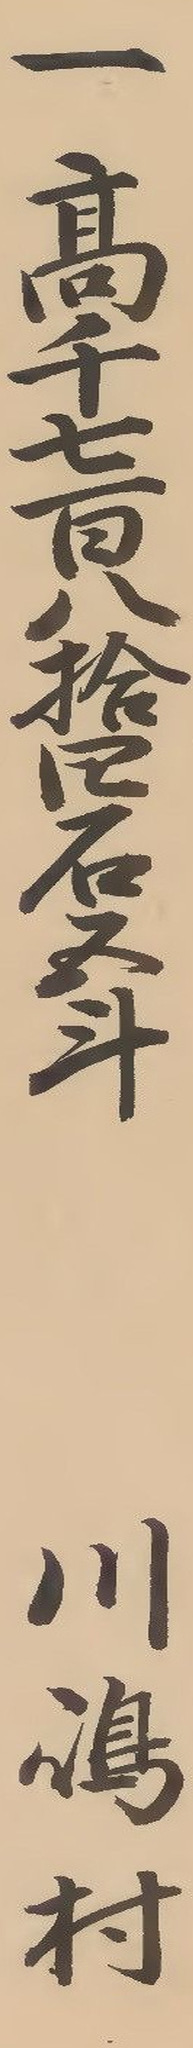一高千七百八拾四石五斗川島村
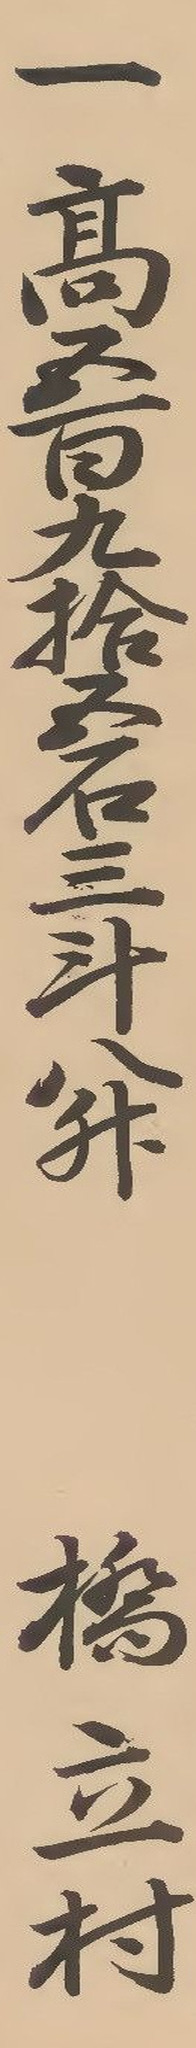一高五百九拾五石三斗八升橋立村
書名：越前国郷帳
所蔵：国立公文書館 National Archives of Japan
